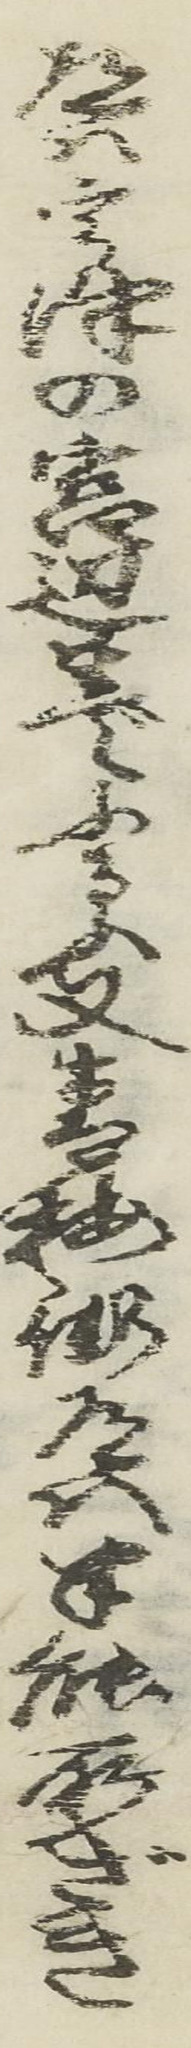道は宇津の宮辺までふるふ又青梅街道は半能所ざき
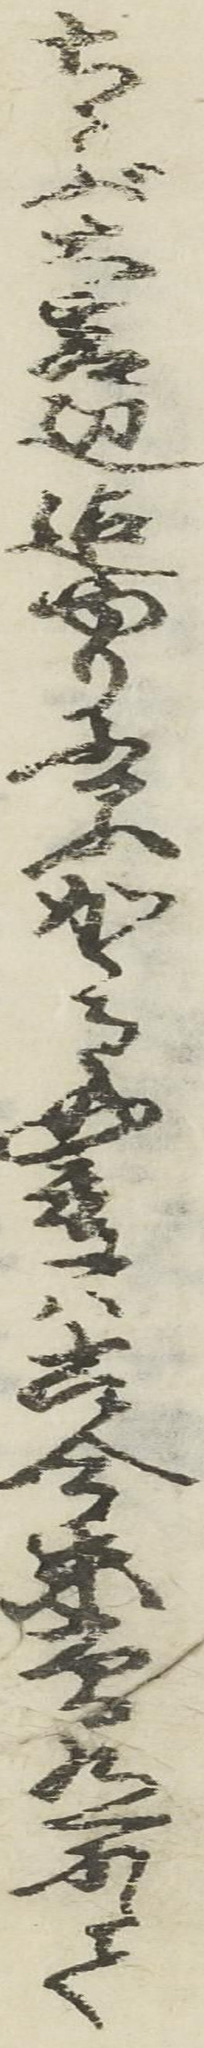ちゝぶ大宮辺迄ゆりふるふかゝる成義は古今未曾有にして
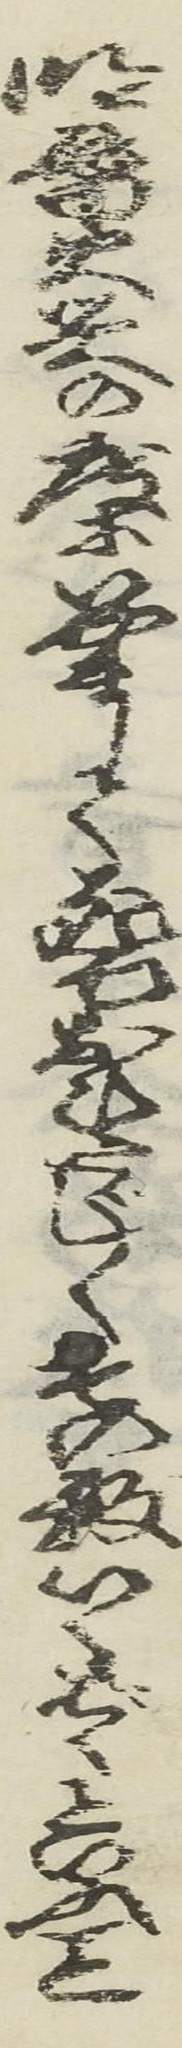明暦火災の度等いやまして死亡おびたゞしくその数いくばくといふこと
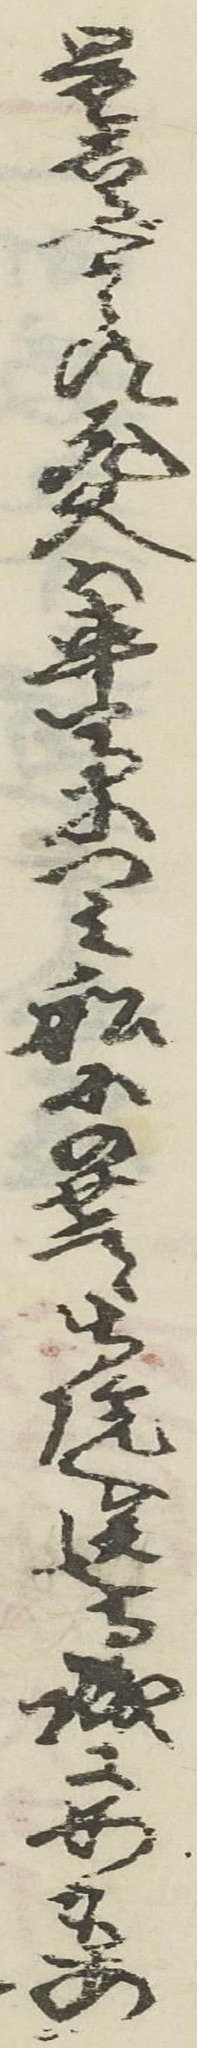量しるべからす死人は車馬につみ船にのせて寺院へ送る磯に舟もあ
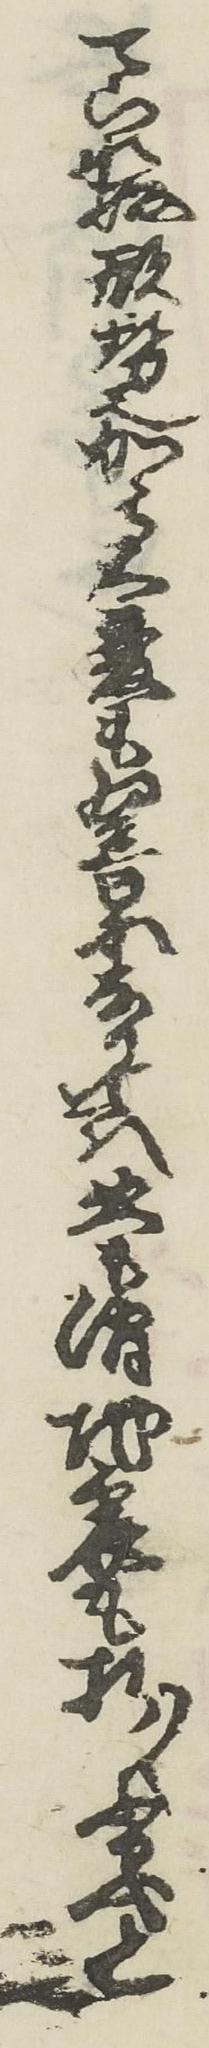てられ形勢也かゝる大変も翌日になりては火も消地震も打ふるへと

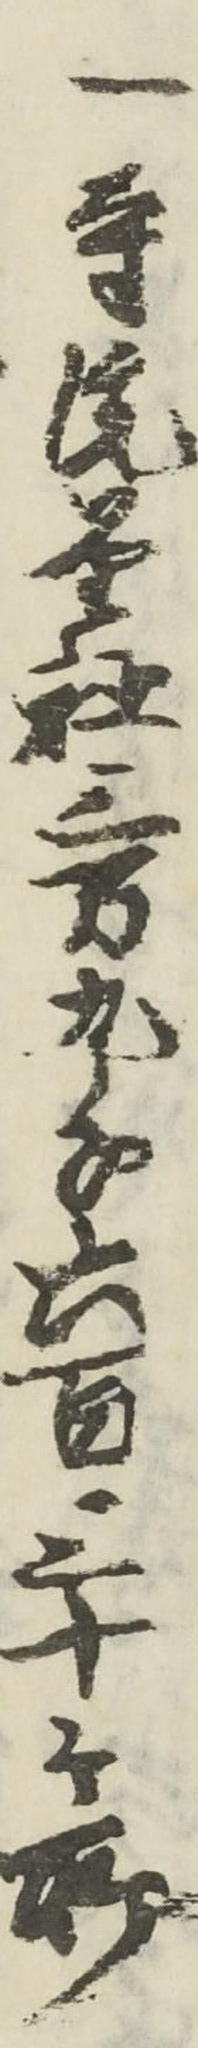一寺院堂社三万九千六百三十ケ所
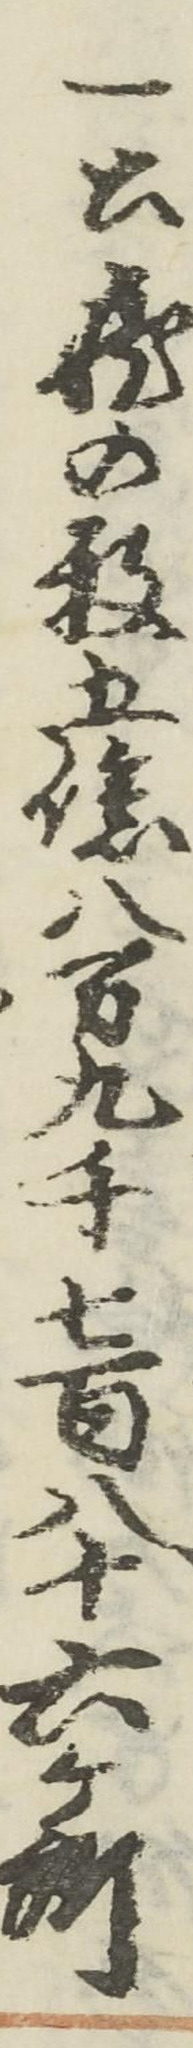一土蔵の数五億八万九千七百八十六ケ所」
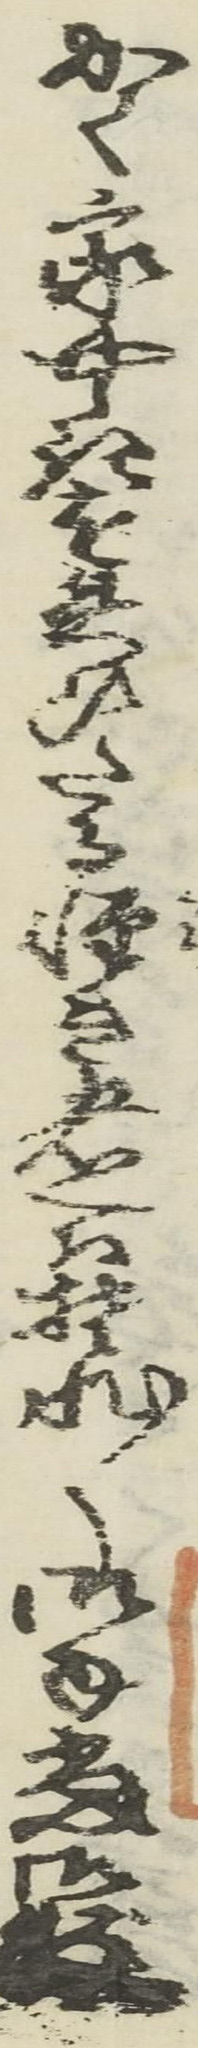加て家やしきを失ひたる軽かろき者へハそれ〳〵御手当御救
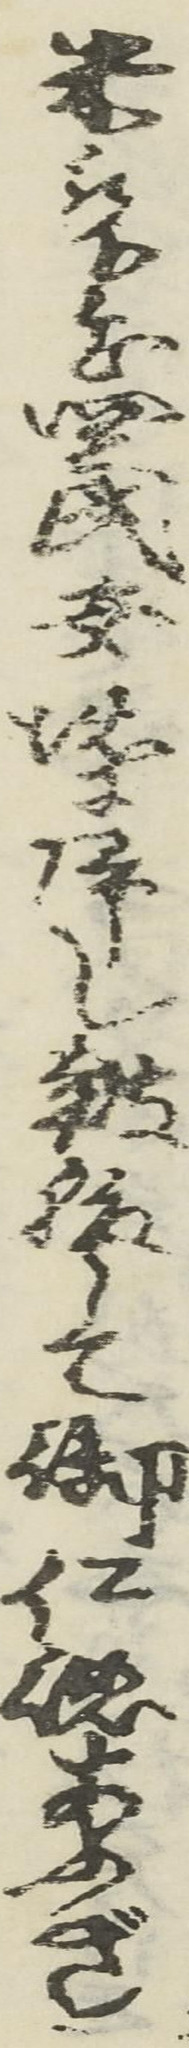米被下置四民安堵に帰し鼓腹して御仁徳あふぎ
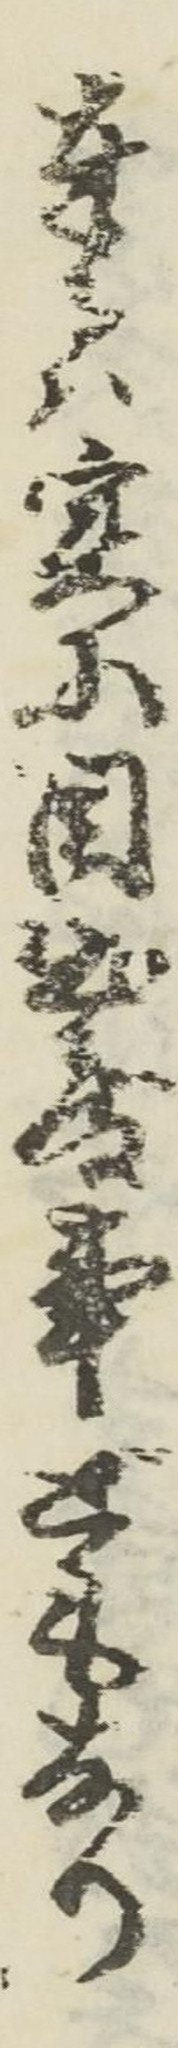奉るは実に目出度事どもなり
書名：安政乙卯江戸大地震筆記　安政丙辰八月大阪大雷雨之記追加　安政三辰年七月松前辺大地震并八月大風雨記録
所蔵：東京大学地震研究所図書室 Earthquake Research Institute Library, The University of Tokyo, JAPAN
